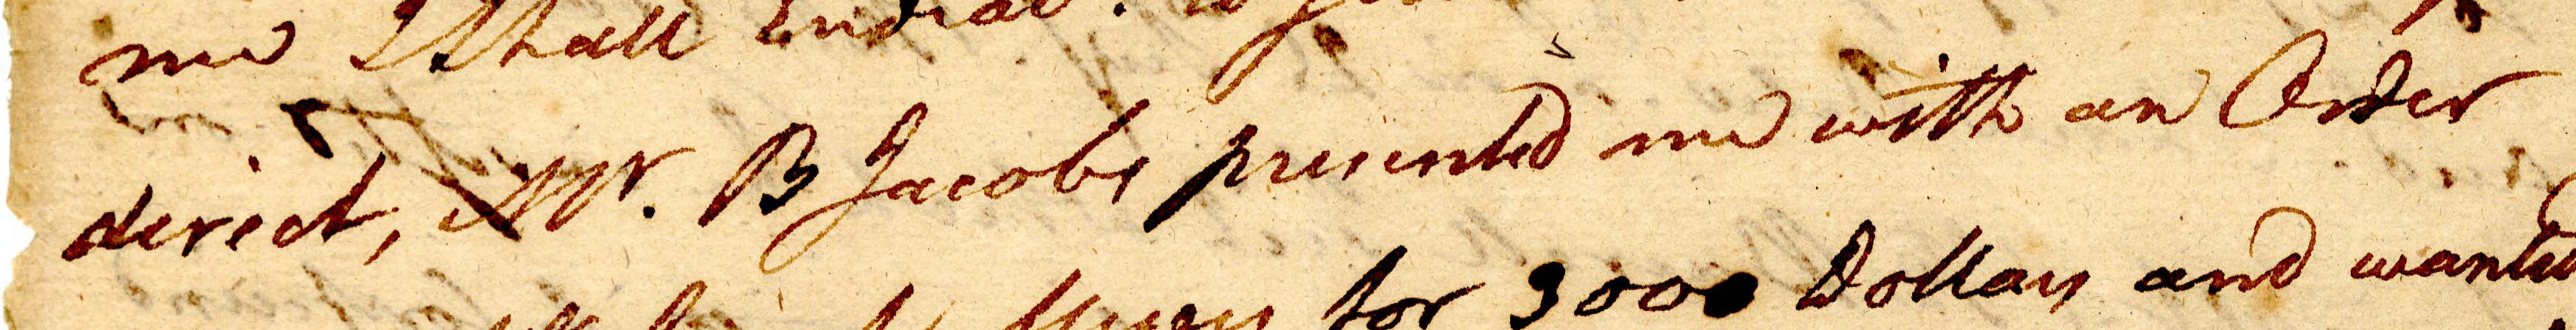direct, M^r. B Jacobs presented me with an Order
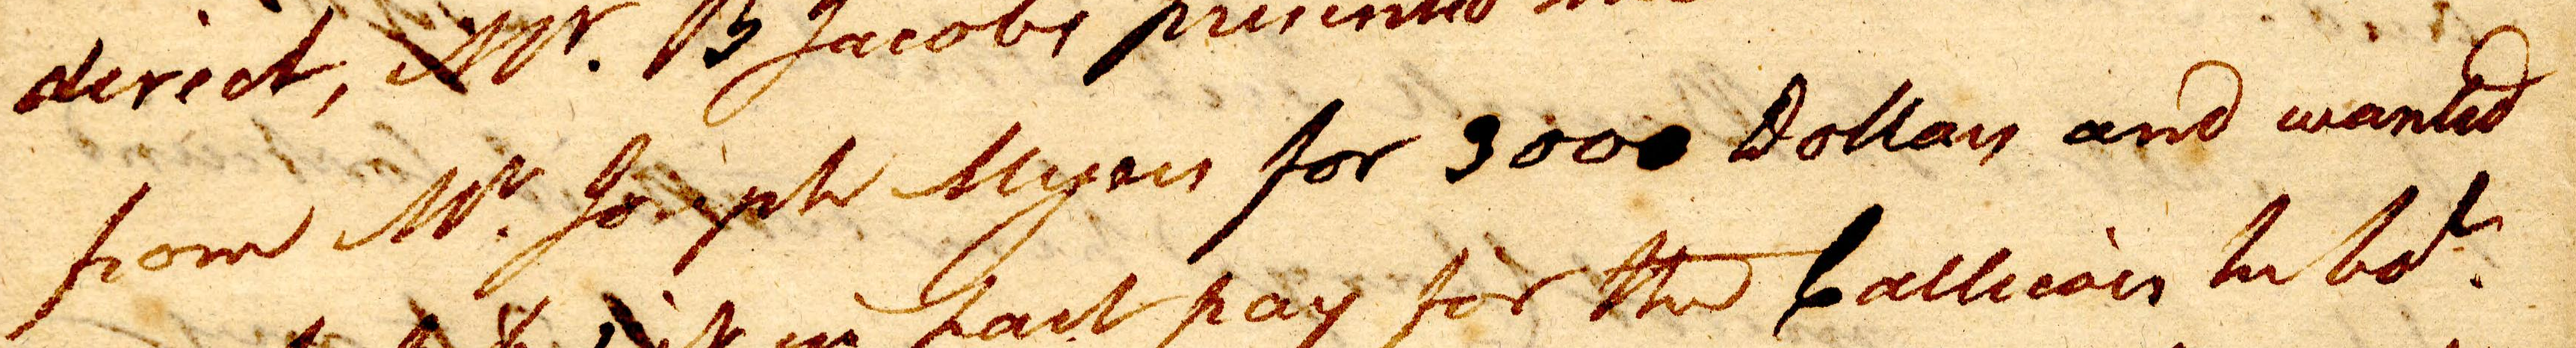from M^r. Joseph Myers for 3000 Dollars and wanted
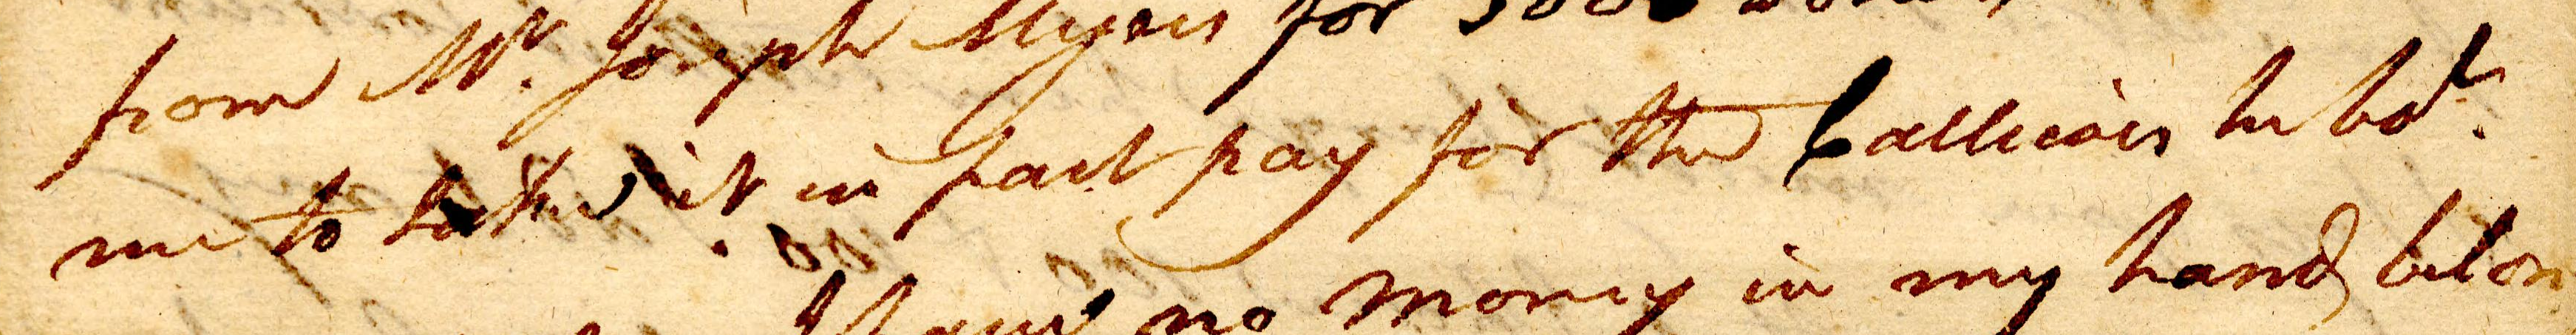me to take is in part pay for the Callicoes he bo^t.
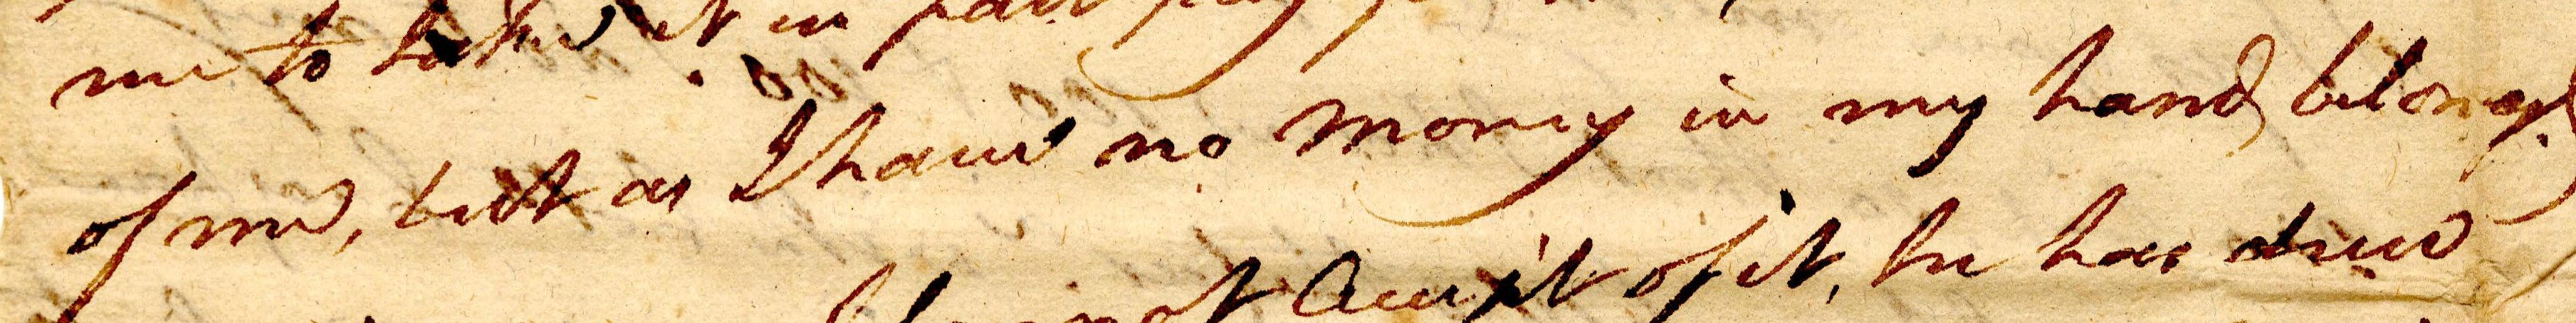of me, but as I have no money in my hand, belong^g.
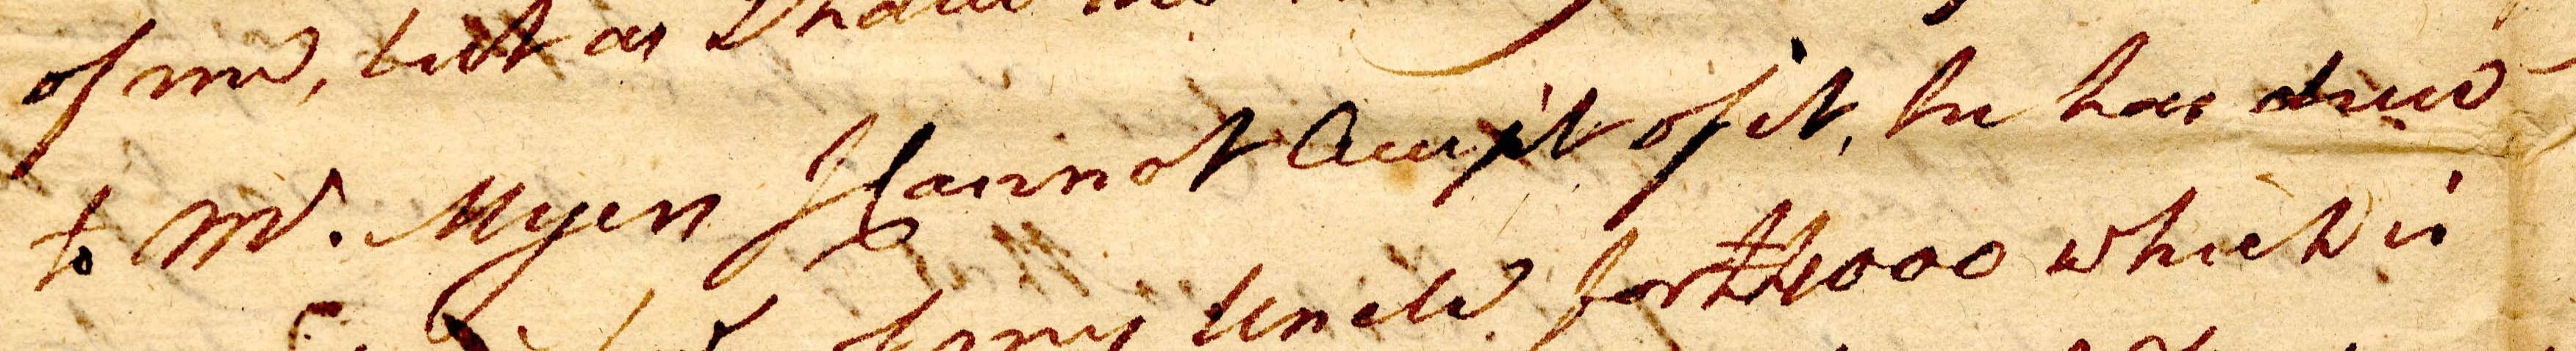to M^r. Myers I Cannot Accept of it, he has drew
